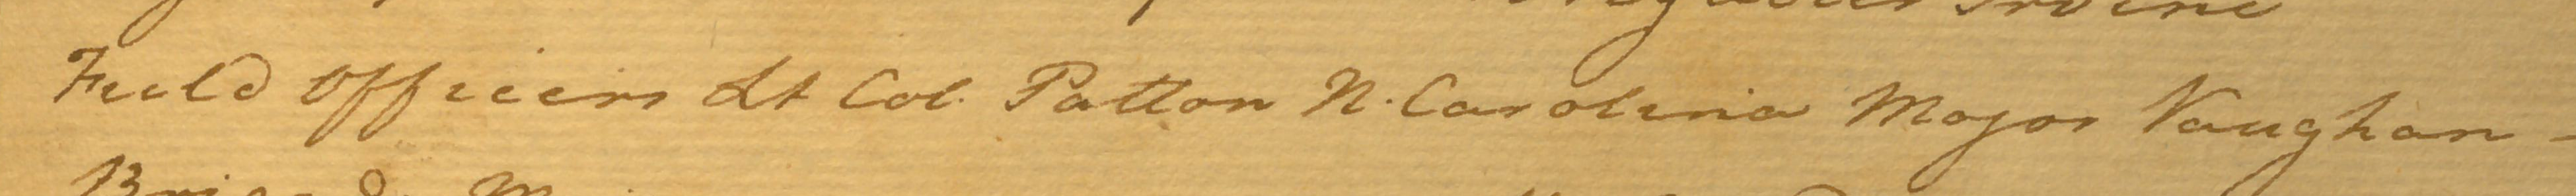Field Officers Lt Col. Patton N. Carolina Major Vaughan
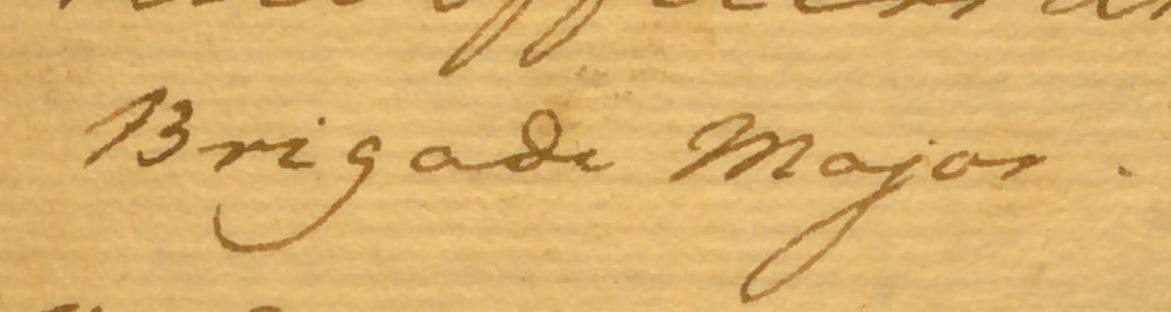Brigade Major
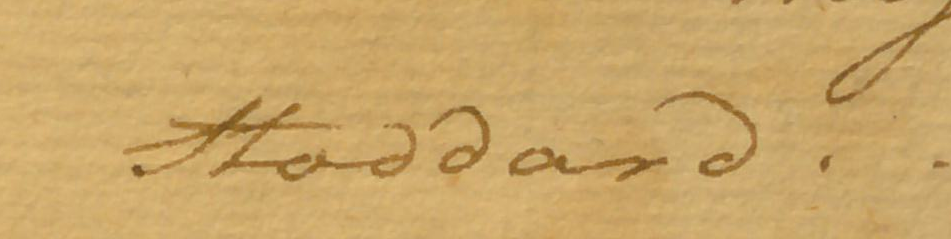Hoddard.
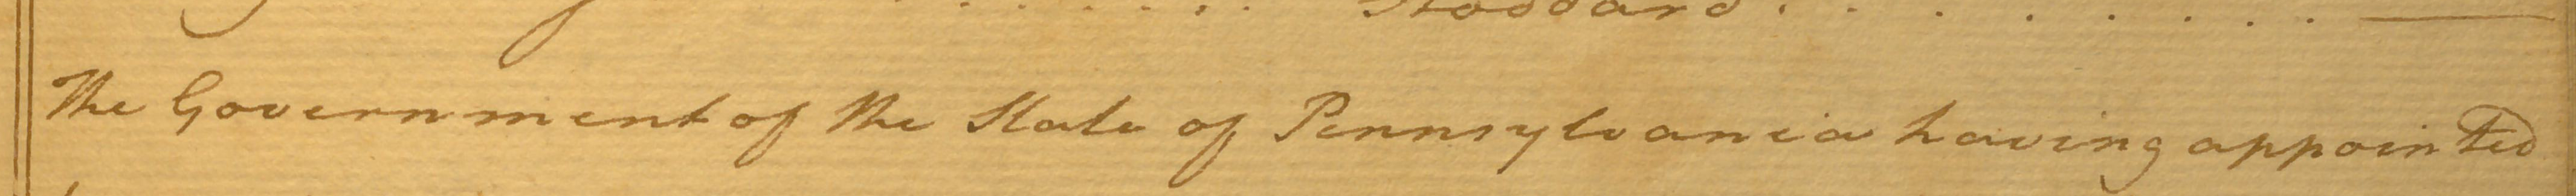The Government of the State of Pennsylvania having appointed
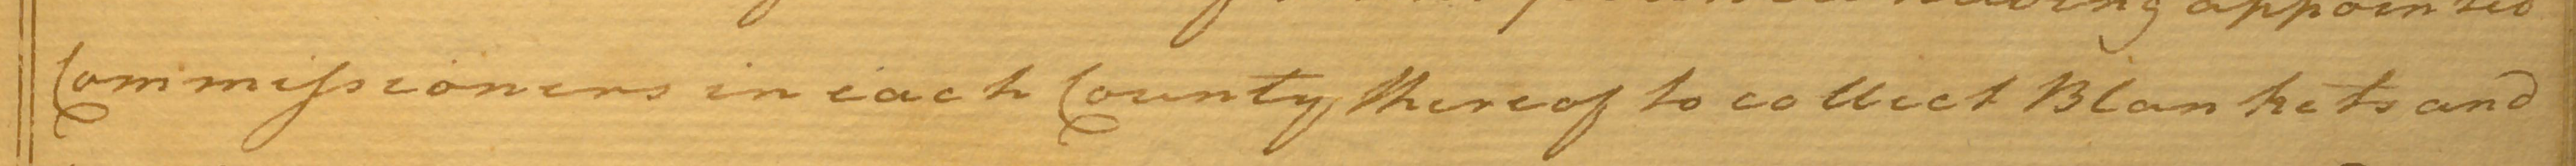Commissioners in each County thereof to collect Blankets and
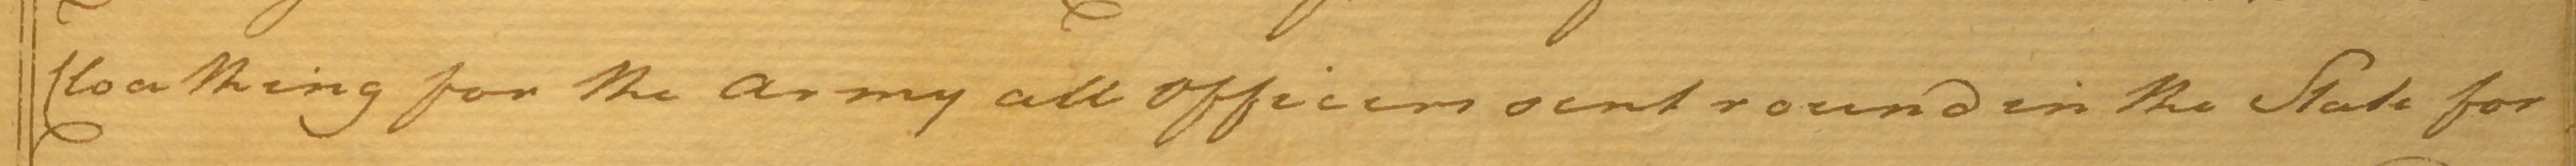Cloathing for the Army all Officers sent round in the State for
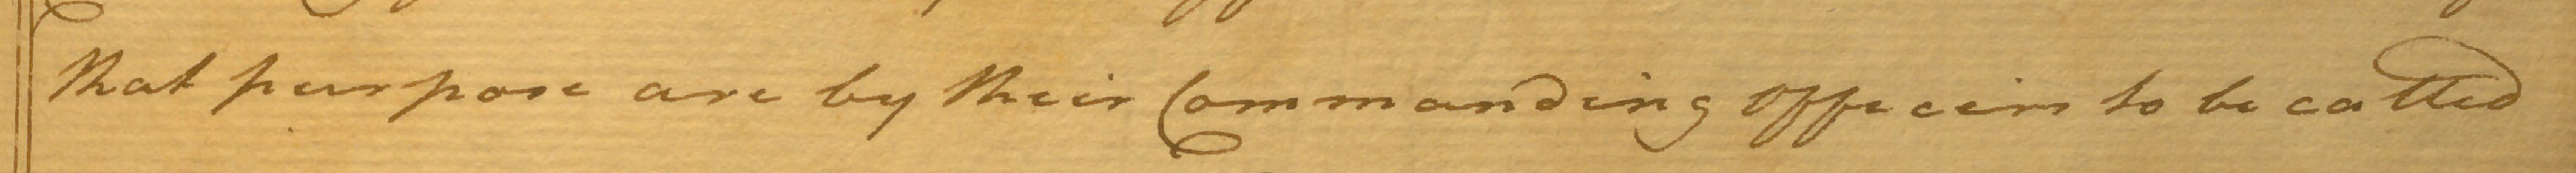that purpose are by their Commanding officers to be called
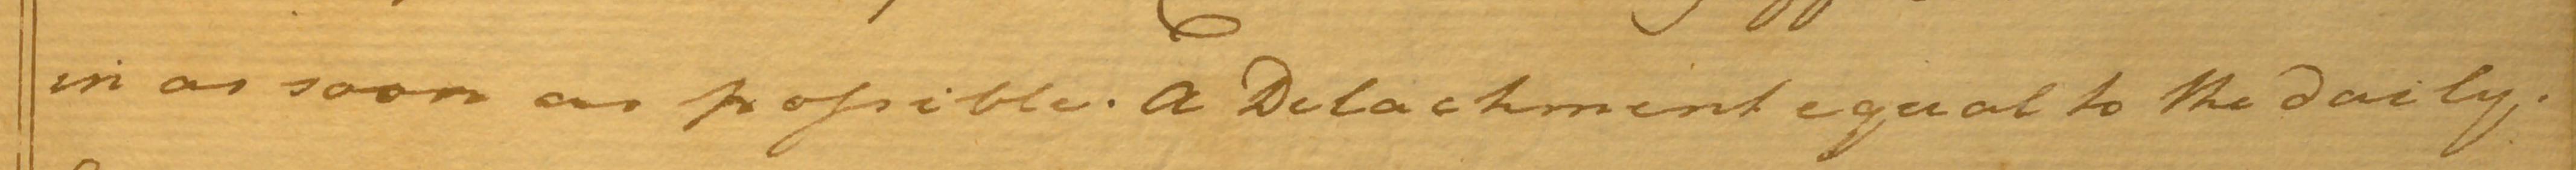in as soon as possible. A Detachment equal to the daily
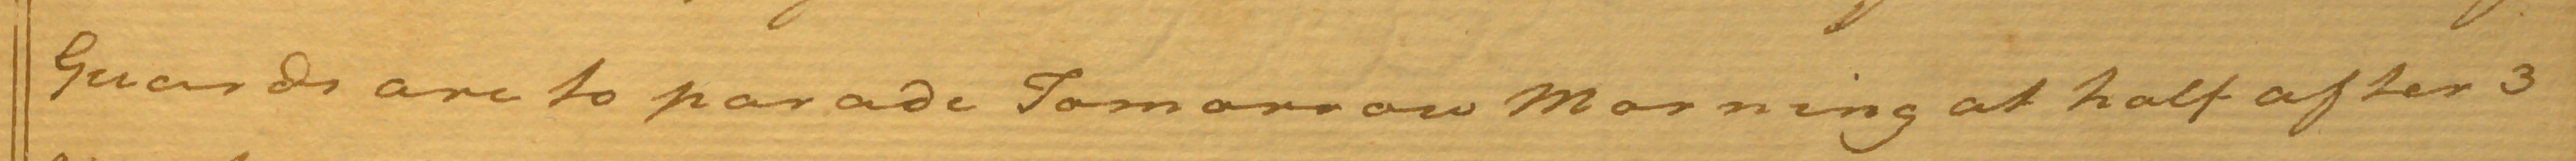Guards are to parade Tomorrow Morning at half after 3
